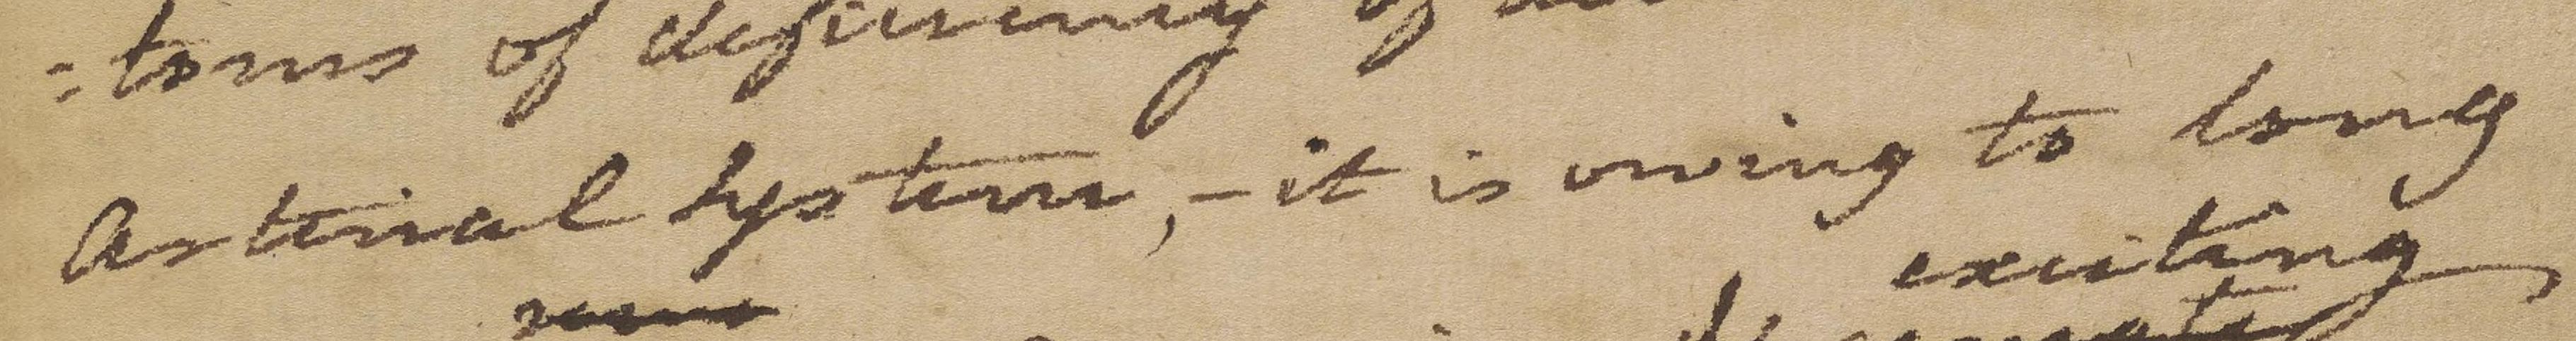arterial system, it is owing to long
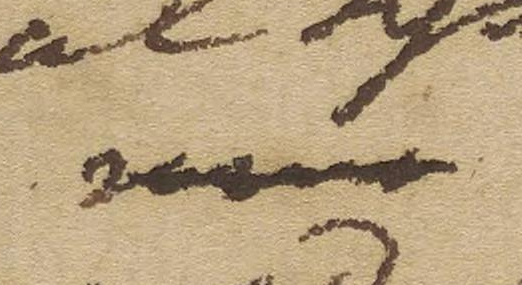senses
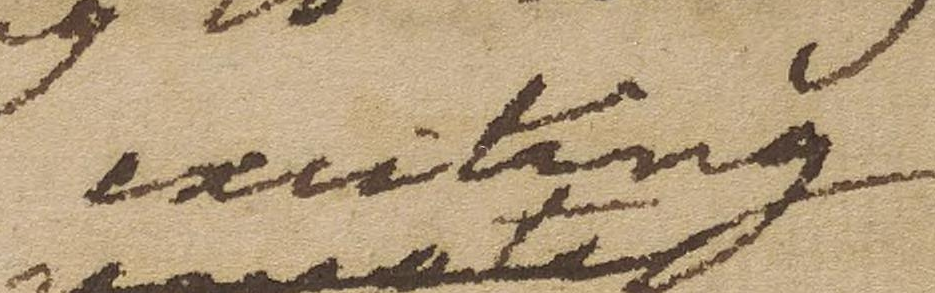exciting
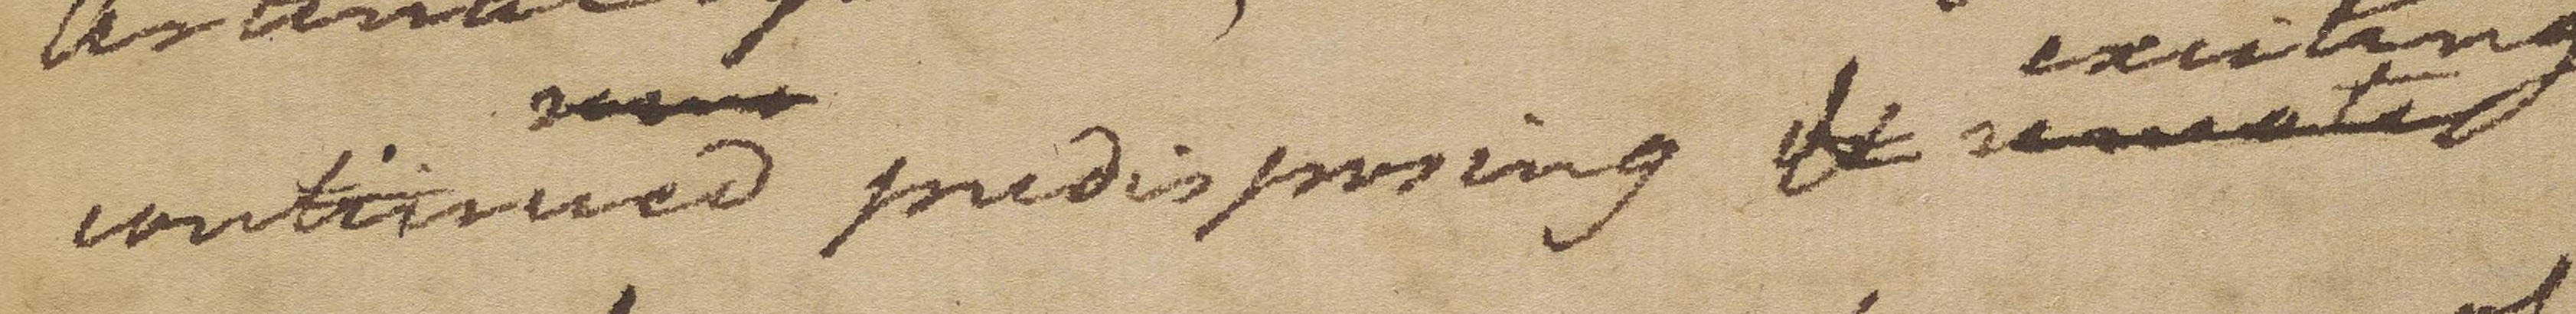continued predisposing & [remote]
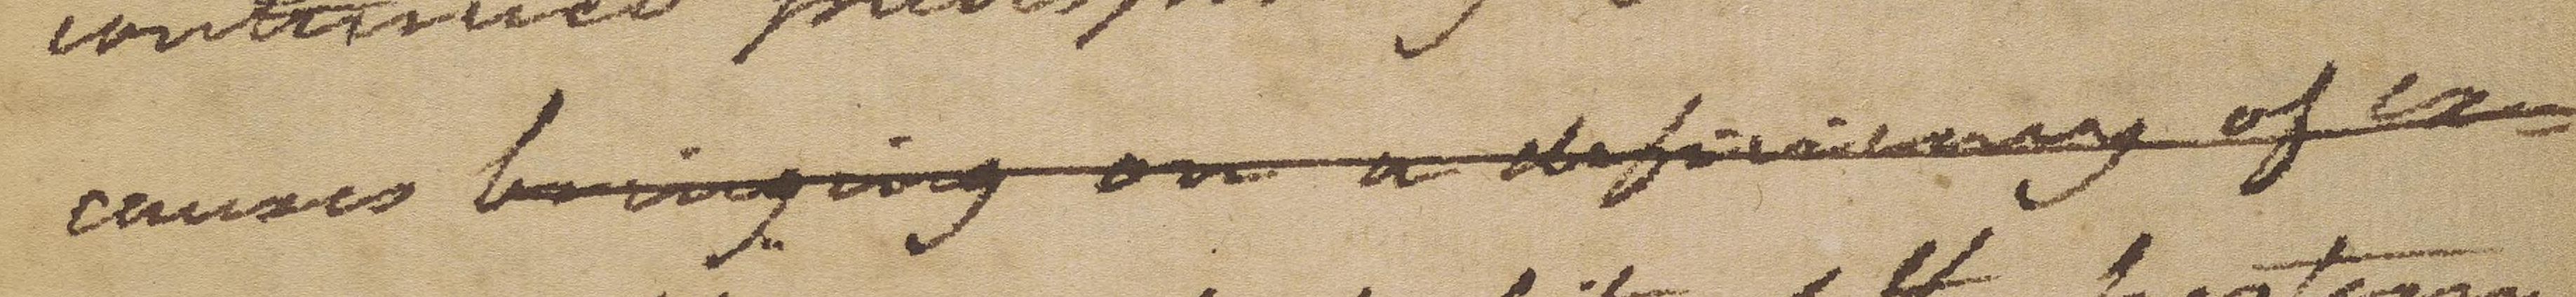causes [bringing on a deficiency of ex-]
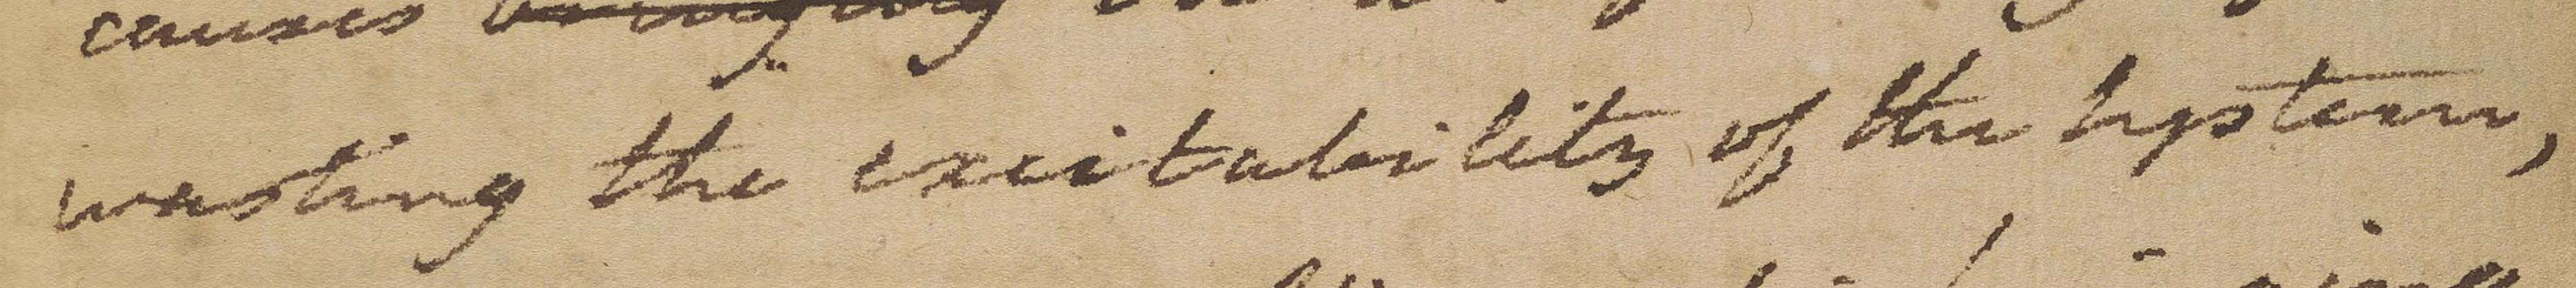wasting the excitability of the system,
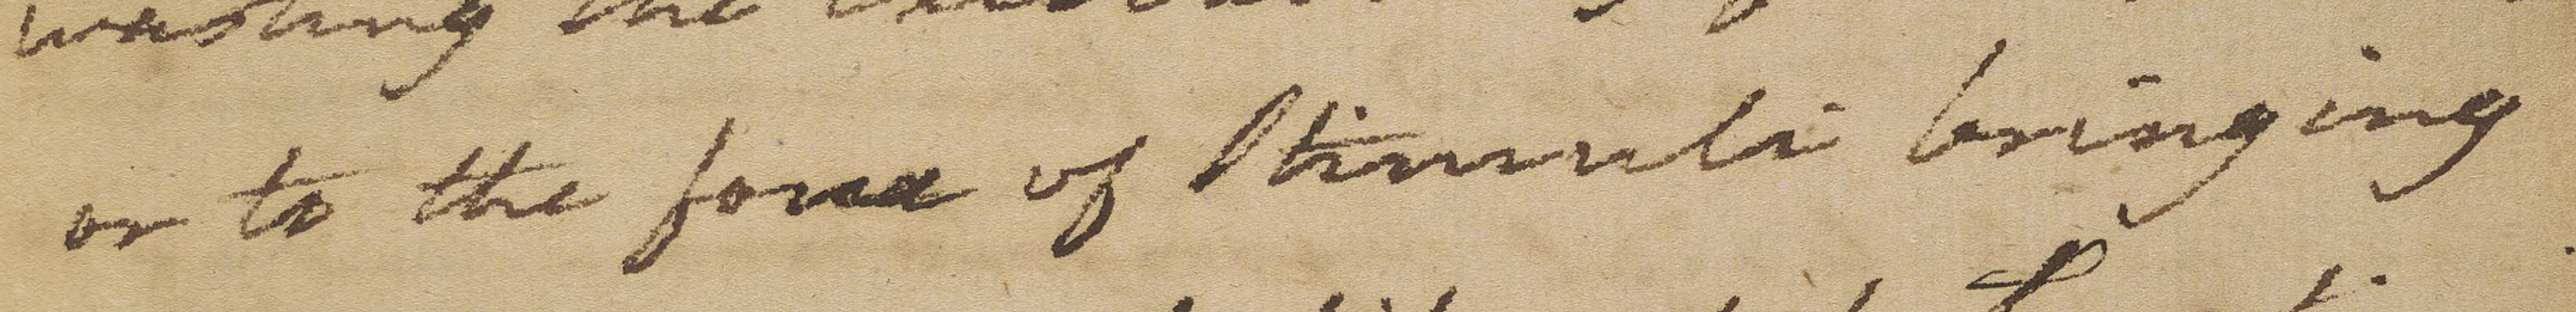or to the force of Stimuli bringing
